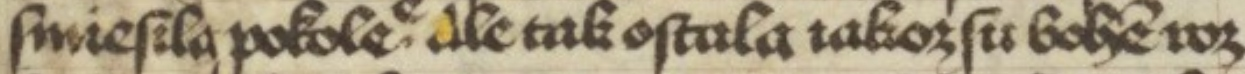ſmieſila pokole.e Ale tak oſtala iakoż ſu bohȇ roz-
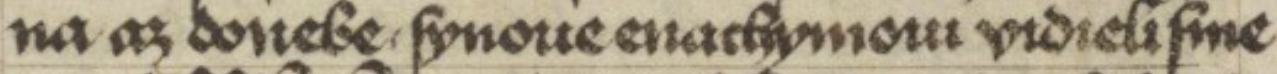na az donebe ſynoue enachymoui vidieli ſme
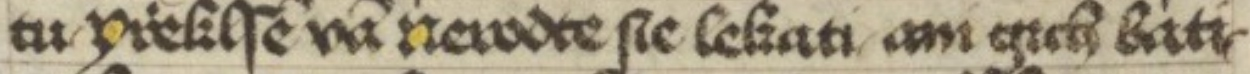tu Yṙeklſȇ vȃ Nerodte ſie lekati ani gich bati
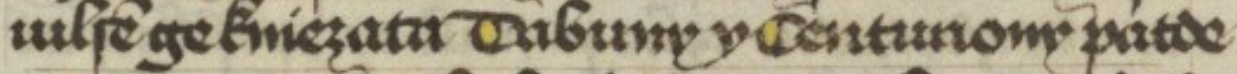uilſȇ ge kniezata Tribuny y Centuriony patde-
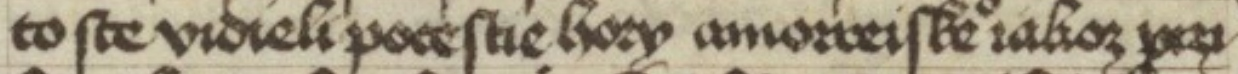to ſte vidieli poceſtie hory amorreiſke° iakoz przi-
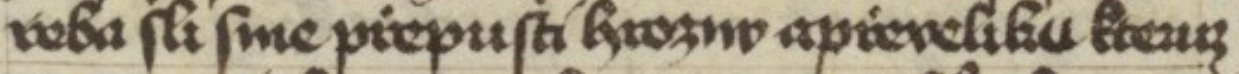reba ẛli ſme pṙepuẛti hroznv apṙeveliku kteruz-
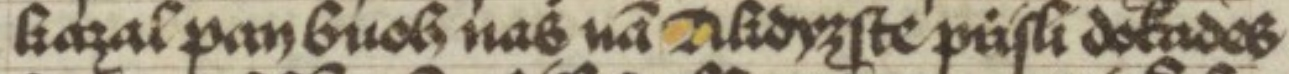kazal pan buoh naṡ na Akdyzſte pṙiſli dokades
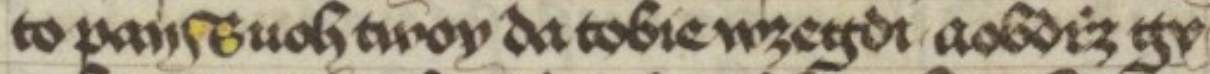to pan Buoh twoy da tobie wzegdi aobdṙz gy
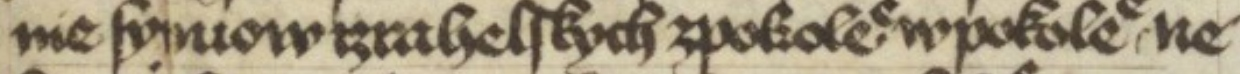nie ſynuow izrahelſkych zpokole.e w pokolee ne-
